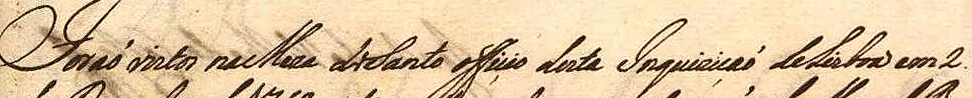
Foraõ vistos na Meza do Santo officio desta Inquiziçaõ de Lisboa em 2.
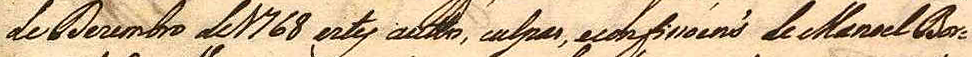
de Dezembro de 1768 estes autos, culpas, e confissoens de Manoel Bor
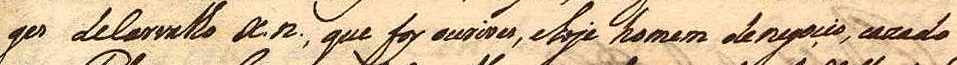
ges de Carvalho x. n., que foy ourives, e hoje homem de negocio, cazado
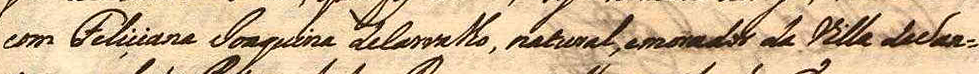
com Feliciana Ioaquina de Carvalho, natural, e morador da Villa de San
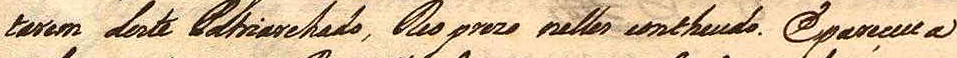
tarem deste Patriarchado, Reo prezo nelles contheudo. E pareceu a
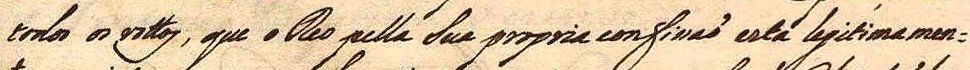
todos os vottos, que o Reo pella Sua propria confissaõ está legitimamen
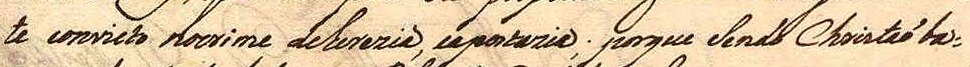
te convicto do crime de herezia e apostazia; porque Sendo Christaõ ba
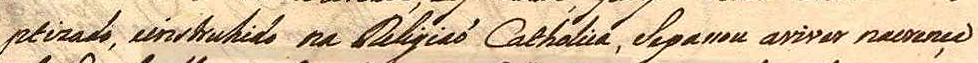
ptizado, e instruhido na Religiaõ Catholica, Se passou a viver na crença
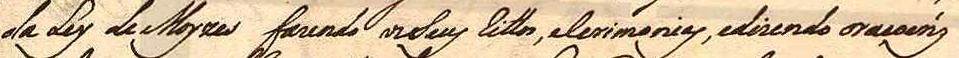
da Ley de Moyzes, fazendo os Seus Rittos, e Cerimonias, e dizendo oraçoenz
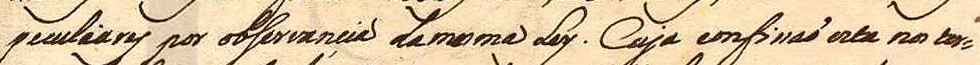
peculiares por observancia da mesma Ley. Cuja confissaõ esta nos ter
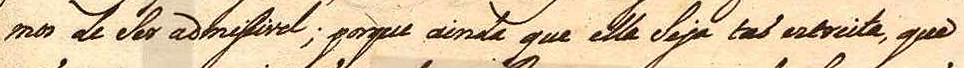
mos de Ser admissivel; porque ainda que ella seja taõ estricta, que
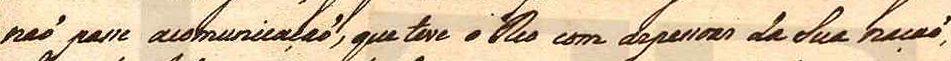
naõ passe a comunicaçaõ, que teve o Reo com az pessoas da Sua naçaõ,
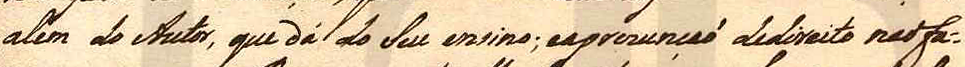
alem do Autor, que dá do Seu ensino; e a prezunçaõ de direito naõ fa
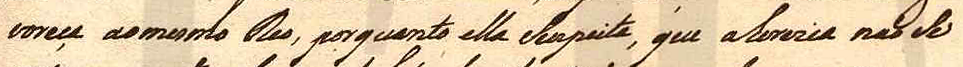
voreça ao mesmo Reo, porquanto ella Suzpeita, que a herezia naõ Se
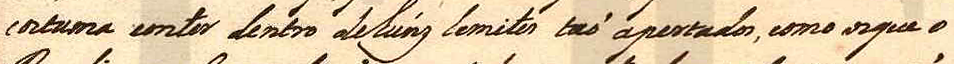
costuma conter dentro de huns lemites taõ apertados, como os que o
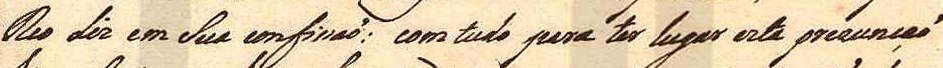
Reo diz em Sua confissaõ: comtudo para ter lugar esta prezunçaõ
